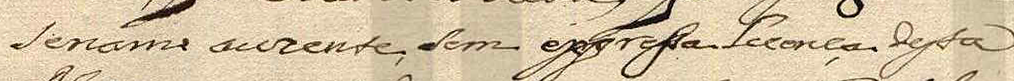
se nam auzente, sem expressa licença desta
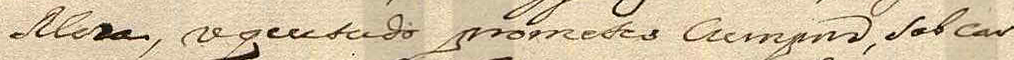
Meza, o que tudo prometeo cumprir sob car
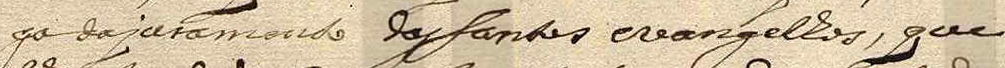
go do juramento dos santos evangelhos, que
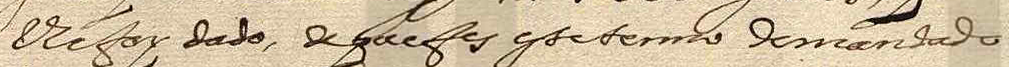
lhe foy dado, de que fes este termo de mandado
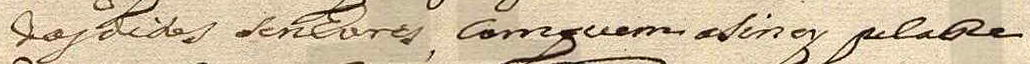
dos ditos senhores com quem asiney pela Re
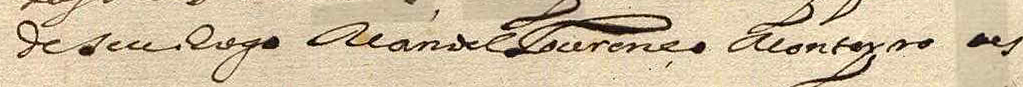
de seu Rogo Manoel Lourenço Monteyro o es
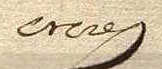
crevj
